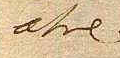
atre
